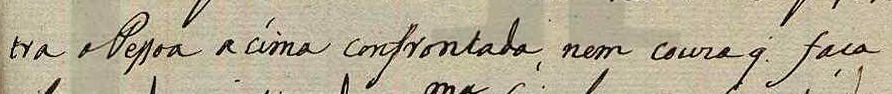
tra a Pessoa acima confrontada, nem couza q̄ faça
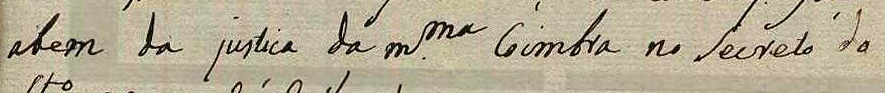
a bem da justiça da m.ma Coimbra no Secreto da
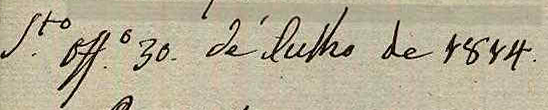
s.to off.o 30. de Iulho de 1814.
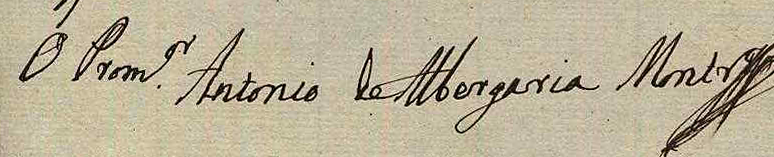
O Prom.or Antonio de Abergaria Montro
